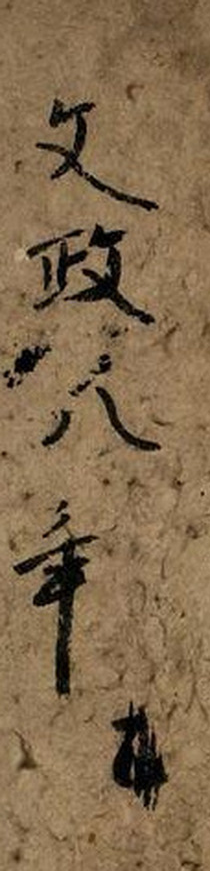文政八年
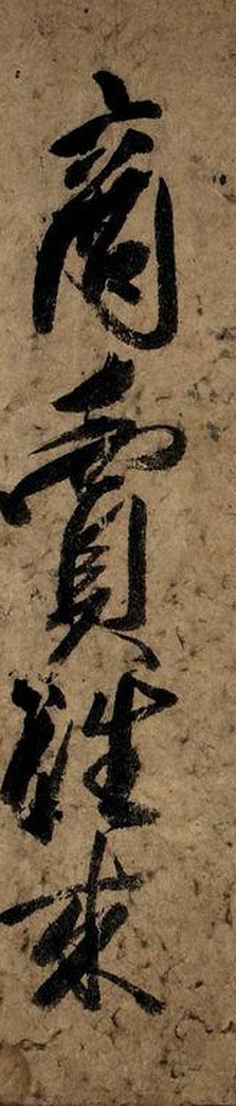商売往来

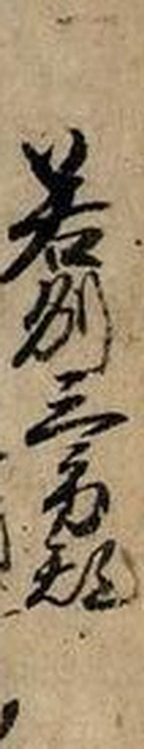若州三方郡
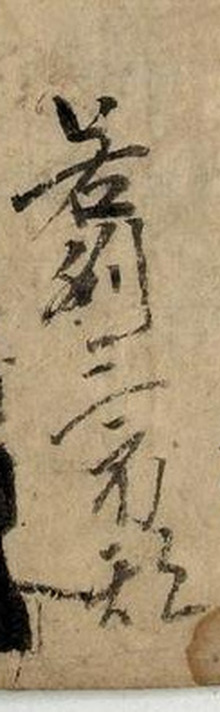若州三方郡
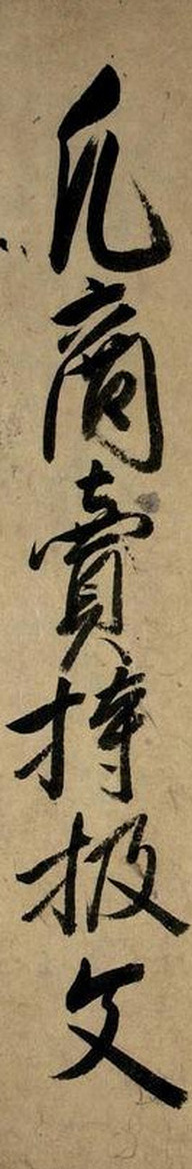凡商売持扱文
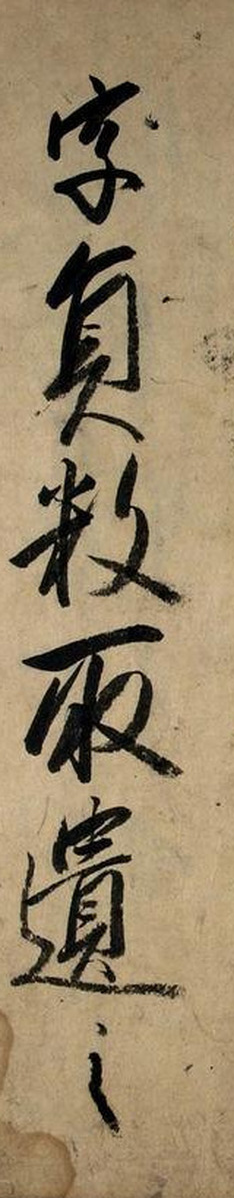字員数取遣之
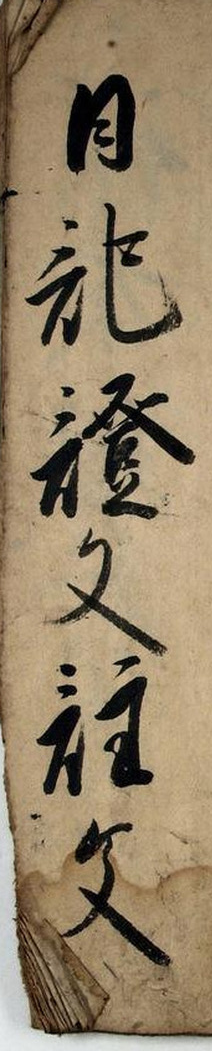日記証文注文

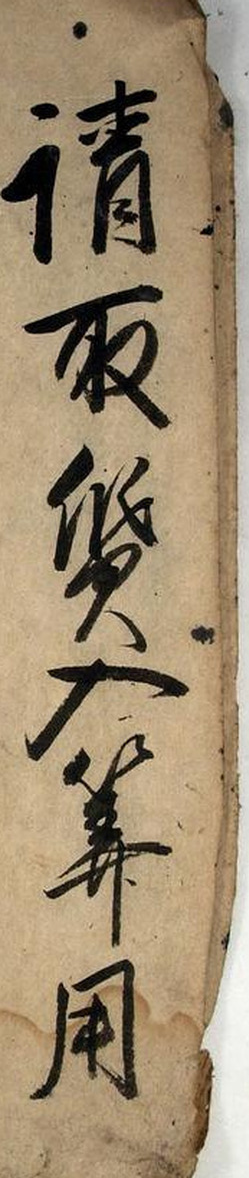請取質入算用
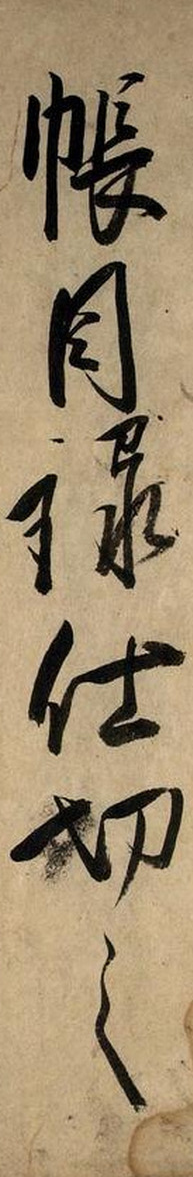帳目録仕切之
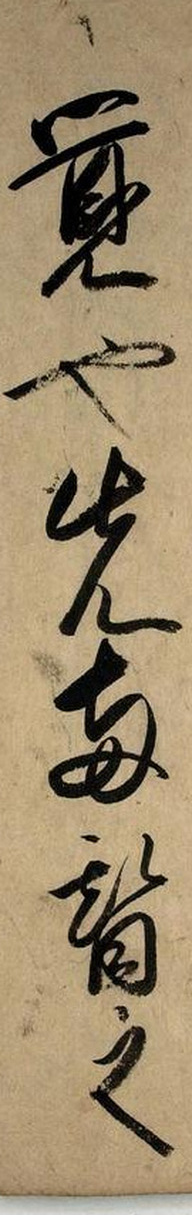覚也先両替之
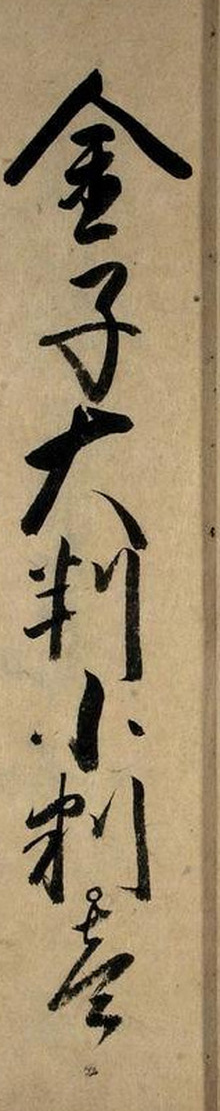金子大判小判壱
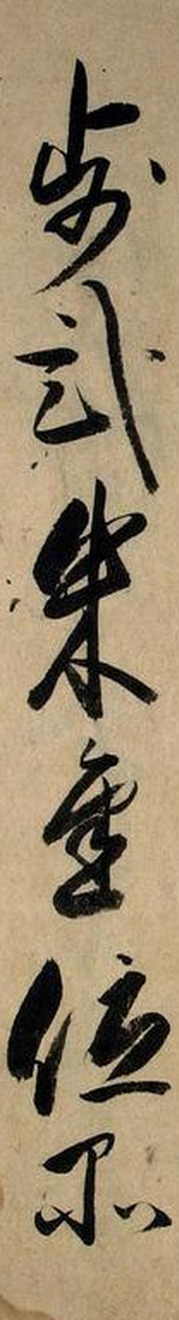歩弐朱金位品
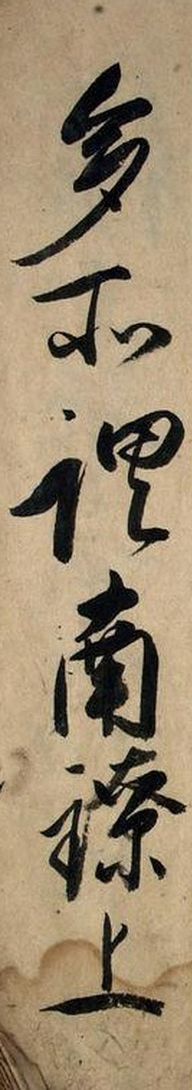多所謂南鐐上

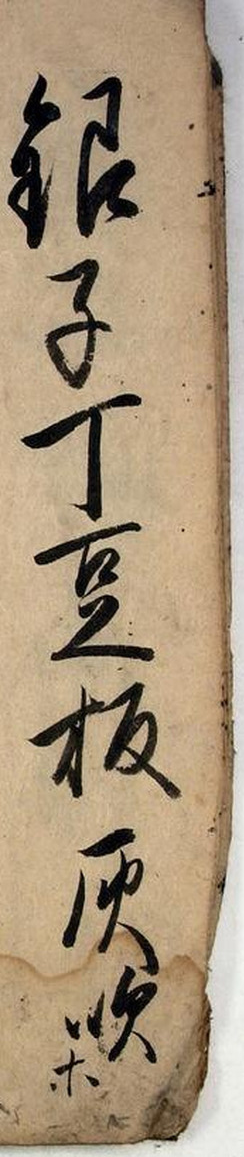銀子丁豆板灰吹等
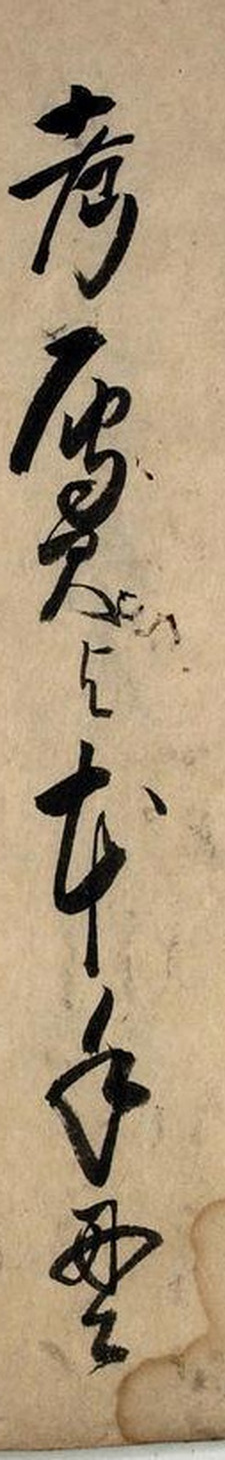考贋与本手貫
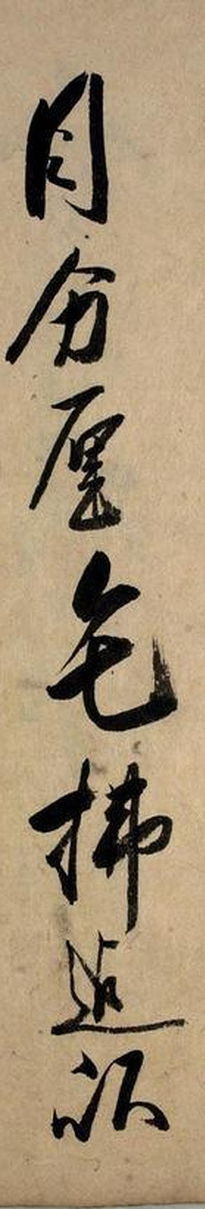目分厘毛払迄以
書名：商売往来（往来物、手習、市之助・市兵衛の名もあり）
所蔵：福井県文書館 Fukui Prefectural Archives
